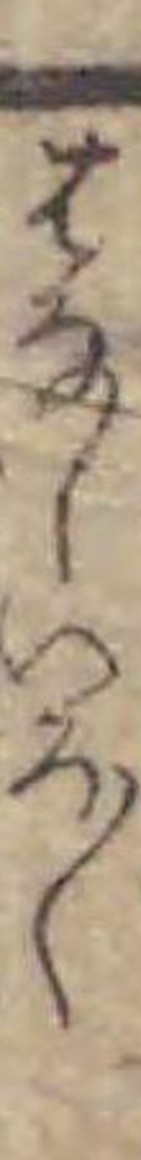はなしいろ〳〵
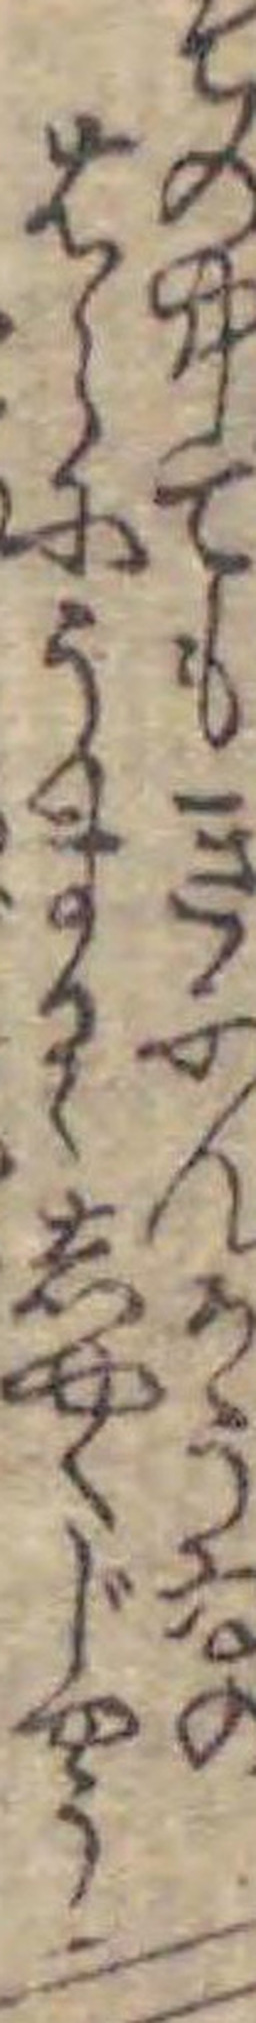はらにうまるゝしやくじやう
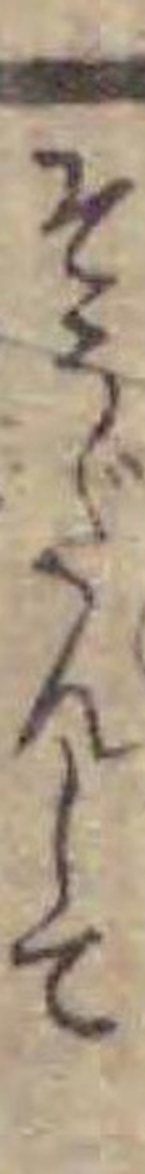そうだんして
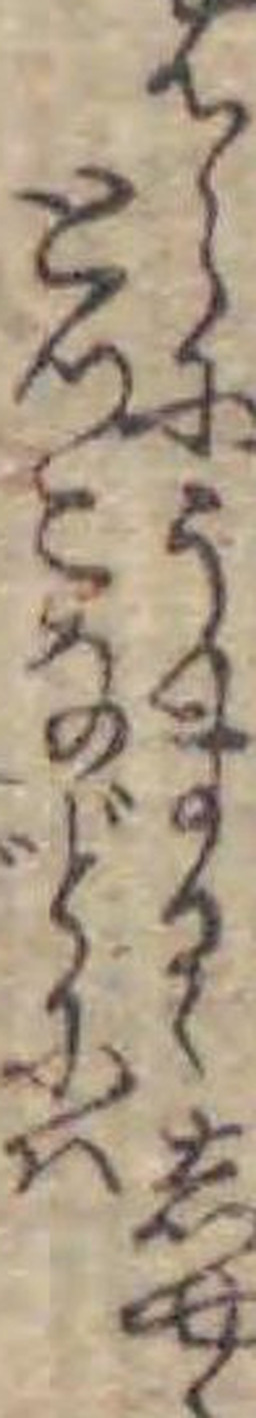とつこなどには
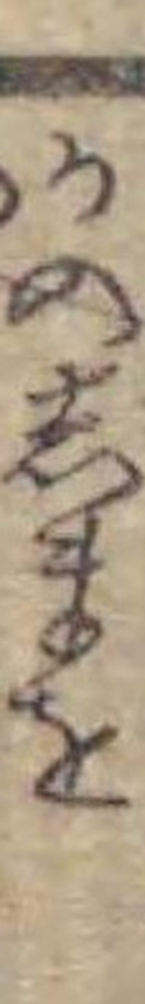かのしまを
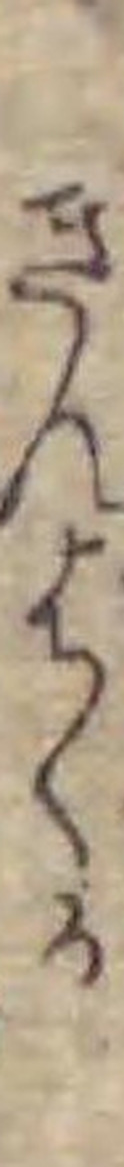きんばくか
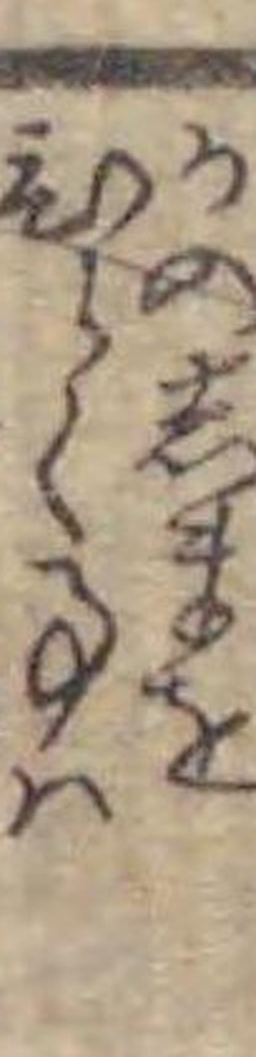ひらく事は
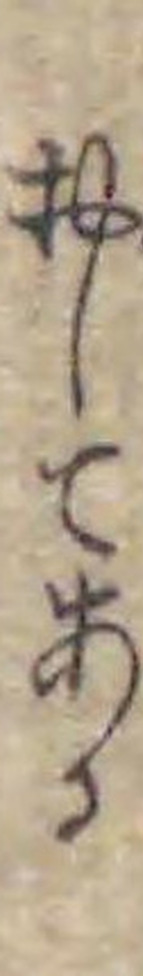おしてある
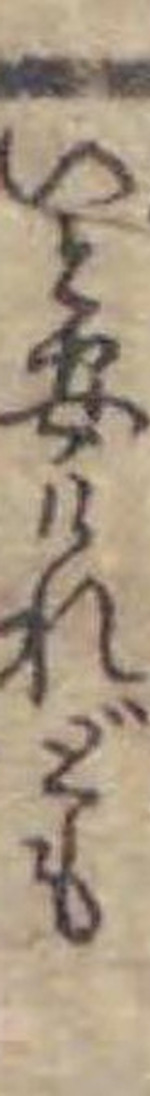いと安けれども
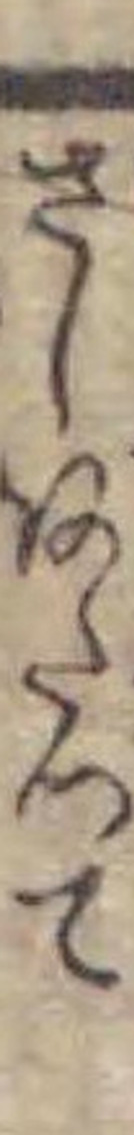さしあたつて
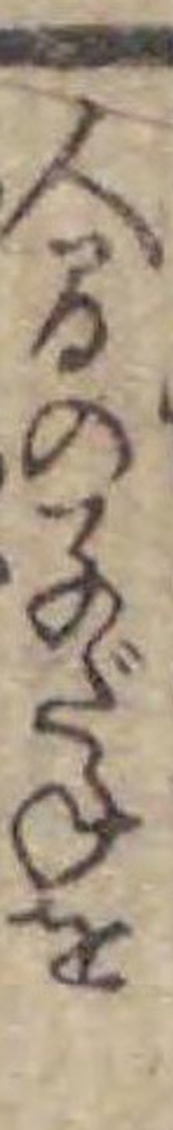人間の子だねを
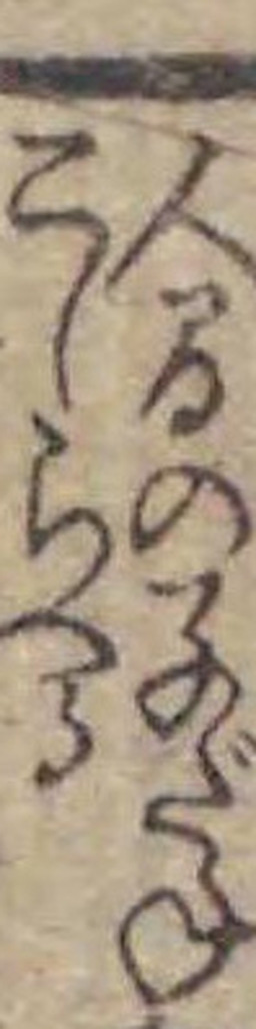こしらへる
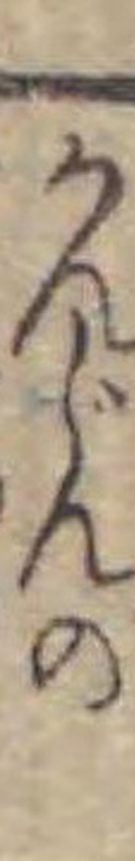かんじんの
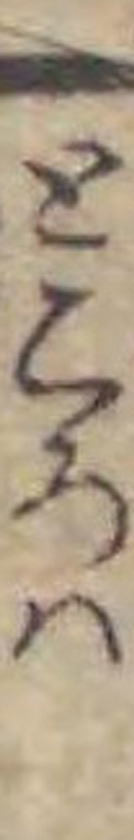ところは
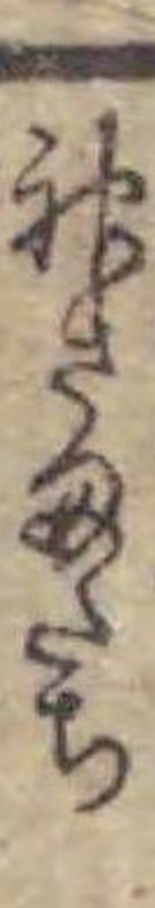神さまたち
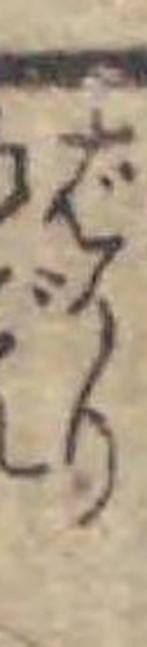ばかり
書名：奇妙頂礼胎錫杖 : 3巻
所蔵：国立国会図書館 National Diet Library, JAPAN
